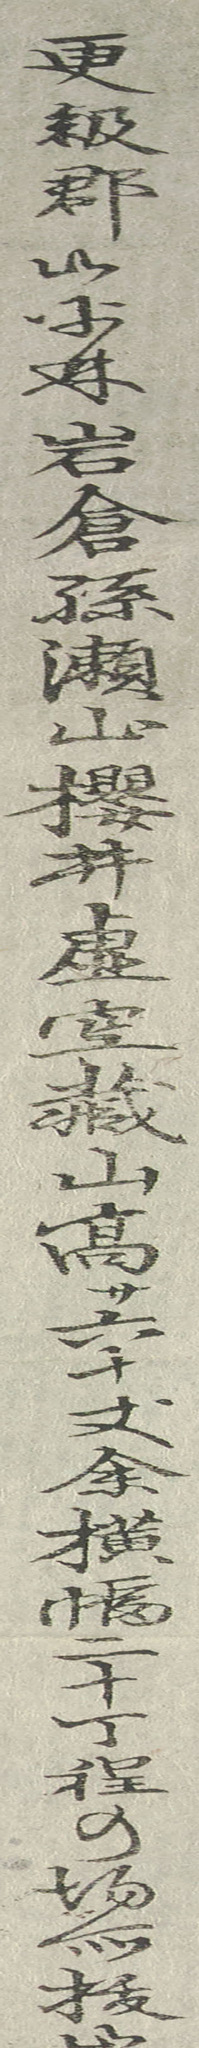更級郡山平林岩倉孫瀬山櫻井虚空蔵山高さ六十丈余横幅二十丁程の場所抜崩れ犀川江
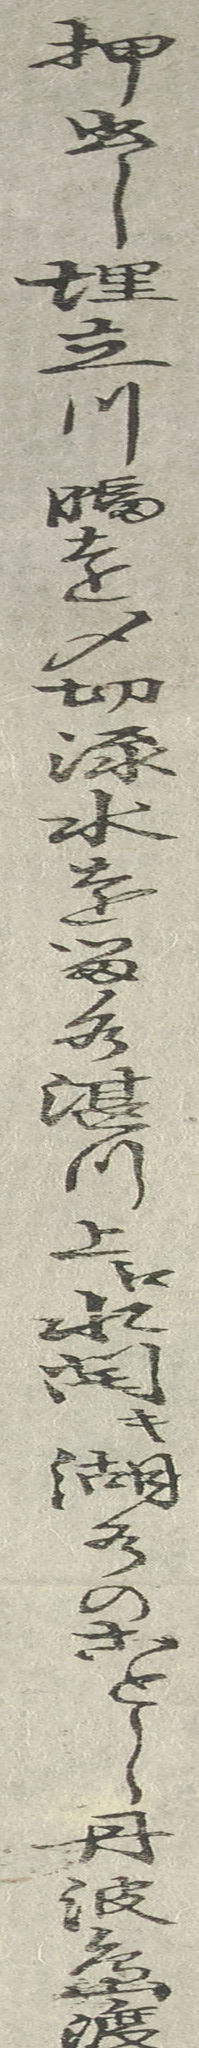押出し埋立川幅を〆切流水を留水湛川上江水開き湖水のことし丹波島渡し場
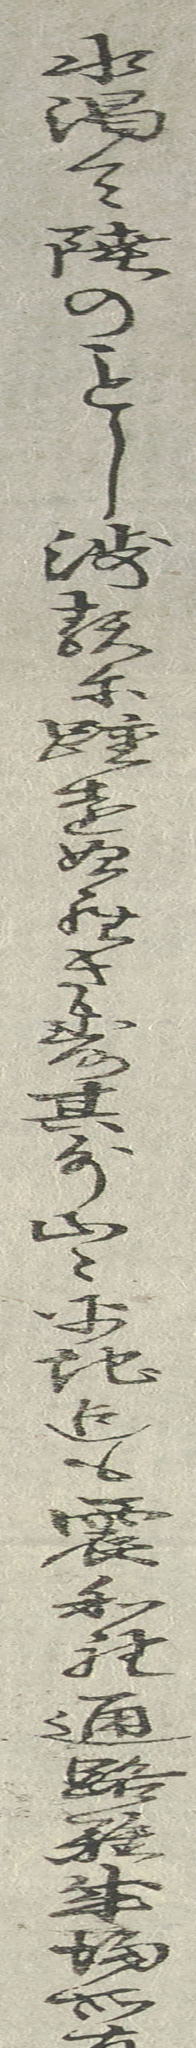水渇て陸のことし渉るに踵をぬらさす其外山々平地迄も震われ通路難成場所有
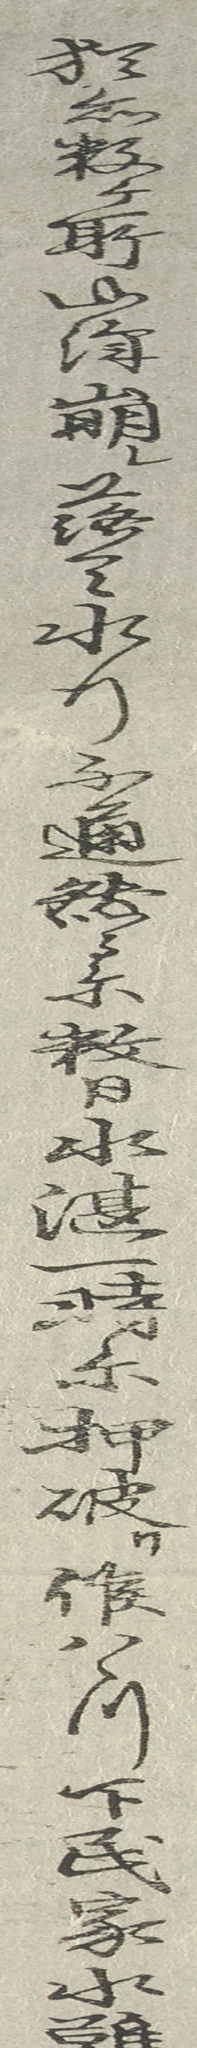猶亦数ヶ所山沢崩れ落て水行不通然るに数日水湛一時に押破り候はゞ川下民家水難の
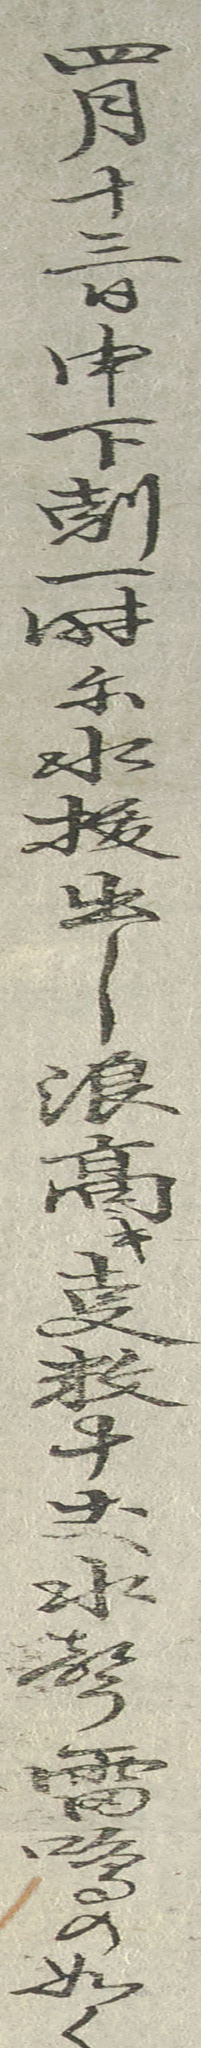四月十三日申下刻一時に水抜出し浪高き事数十丈水声雷鳴の如く
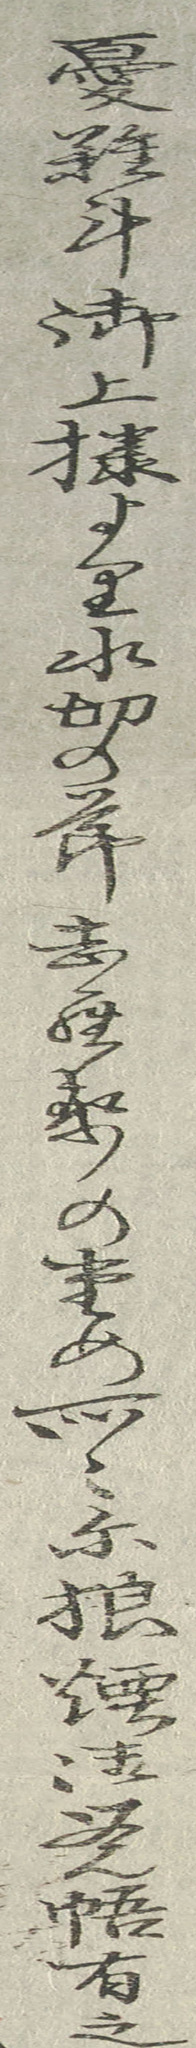憂難斗御上様より水切の節しらせのため所々に狼煙御覚悟有之所
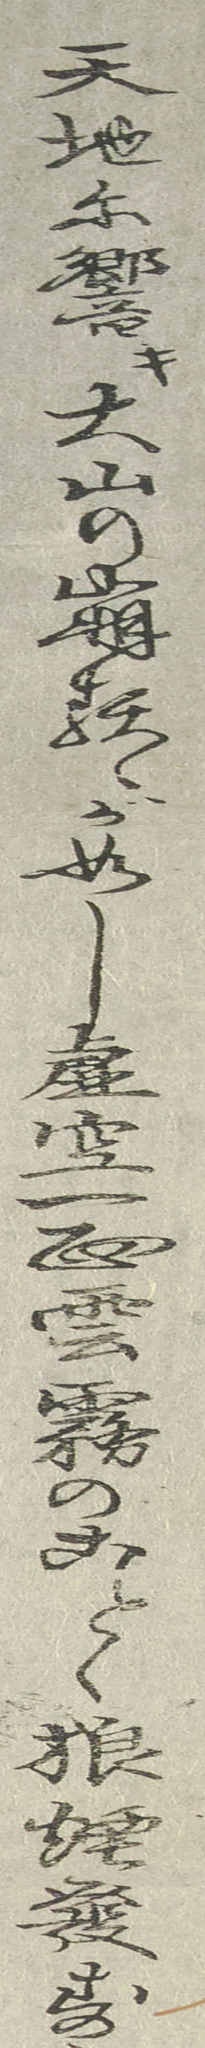天地に響き大山の崩るゝが如し虚空一面雲霧のことく狼煙発すと
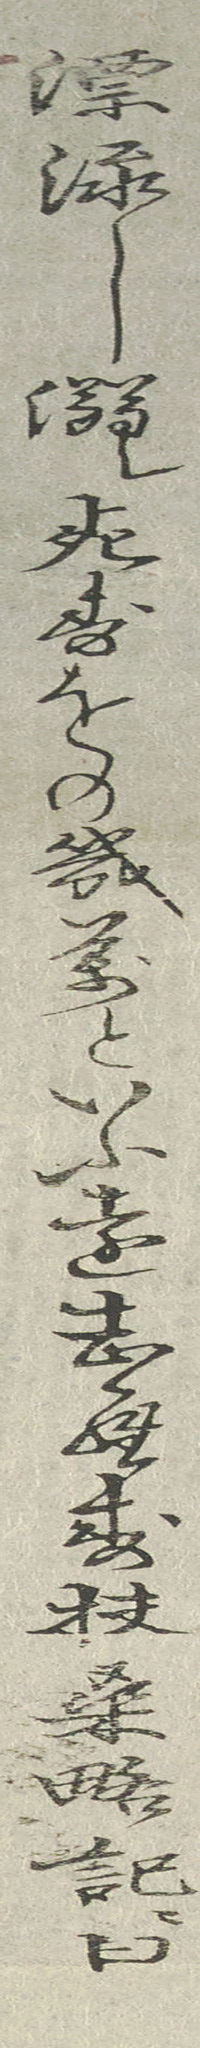漂流し溺れ死すもの幾万といふをしらす扶桑略記に曰
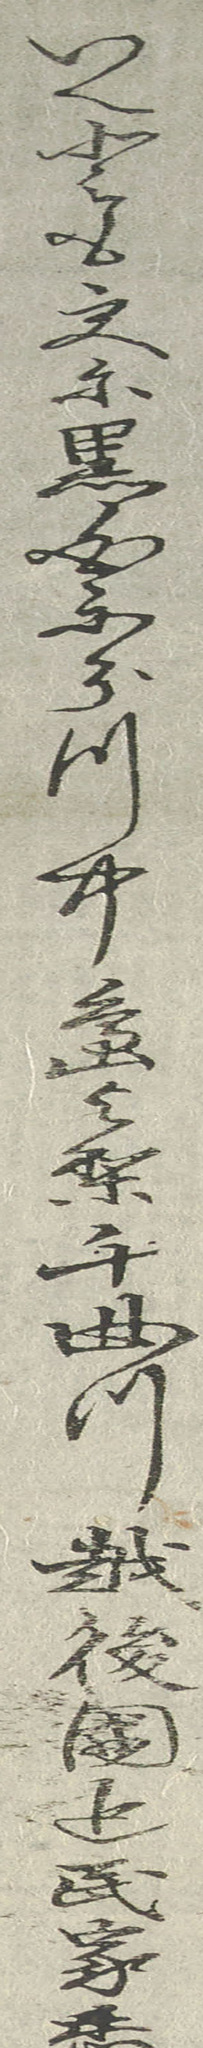いへとも更に黒白不分川中島より千曲川越後国迄民家悉く
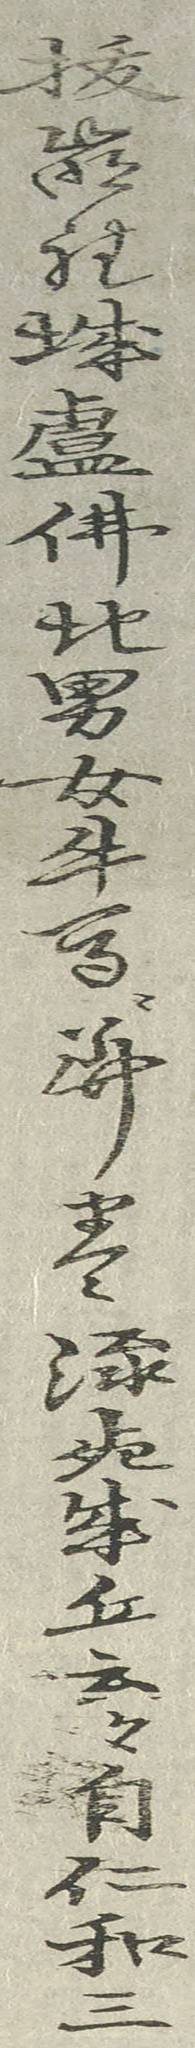抜崩れ城盧仏地男女牛馬に到まて流死成丘云々自仁和三
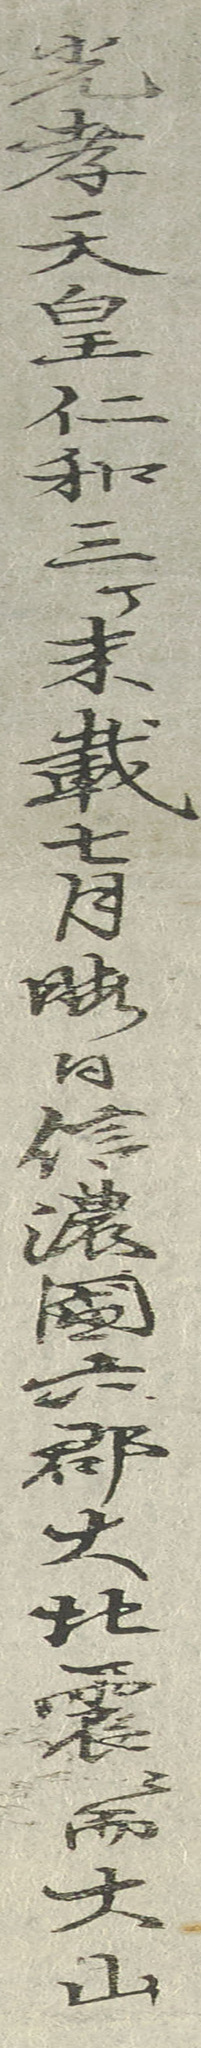光孝天皇仁和三丁未載七月晦日信濃国六郡大地震に而大山
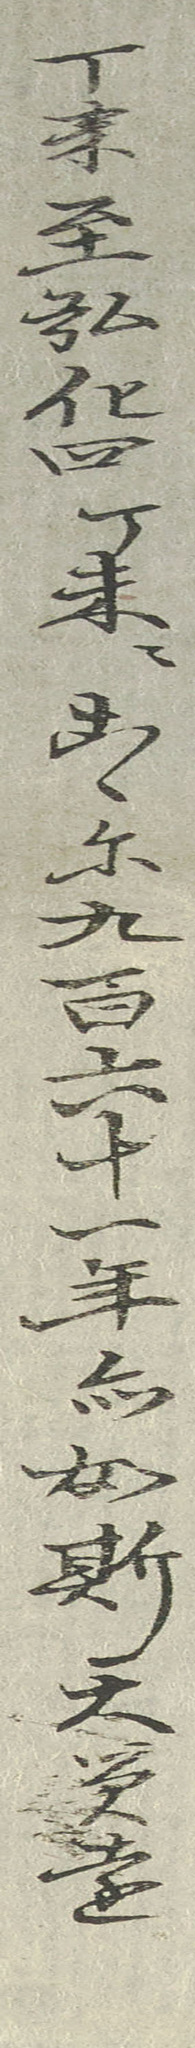丁未至弘化四丁未にこゝに九百六十一年亦如斯天災を
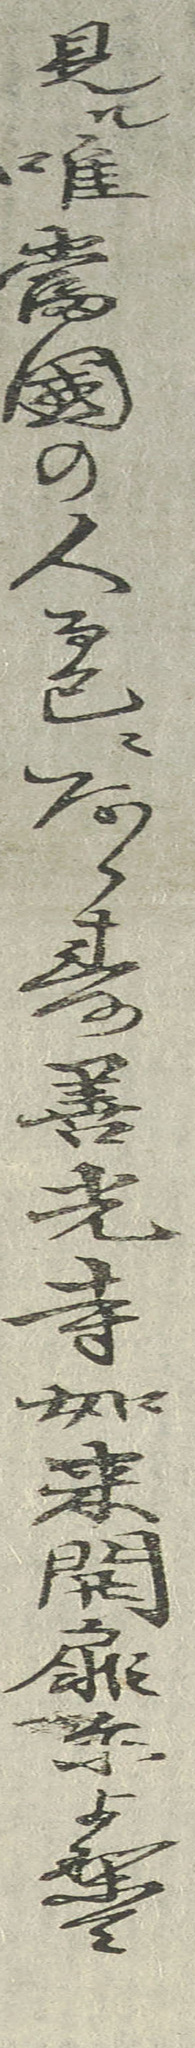見る唯当国の人而已にあらす善光寺如来開扉によりて
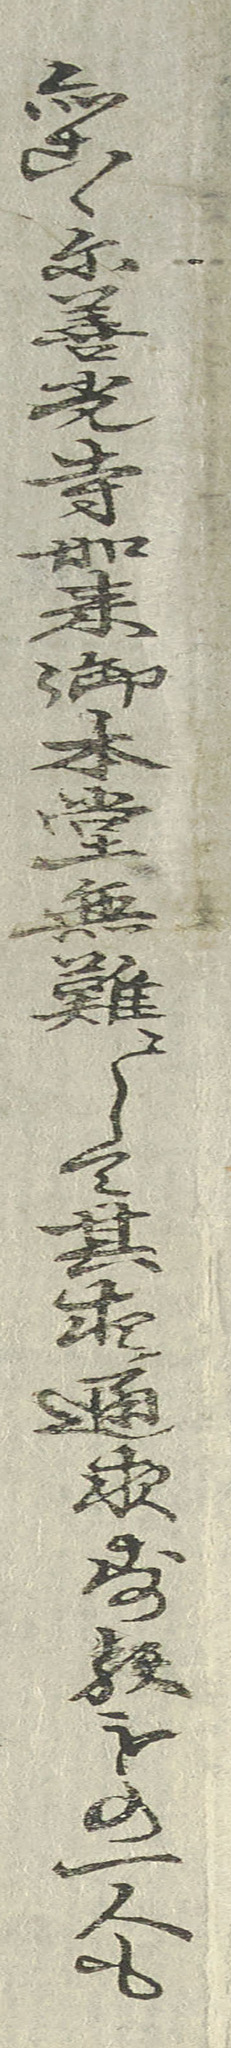亦こゝに善光寺如来御本堂無難にして其夜に通夜するもの一人も
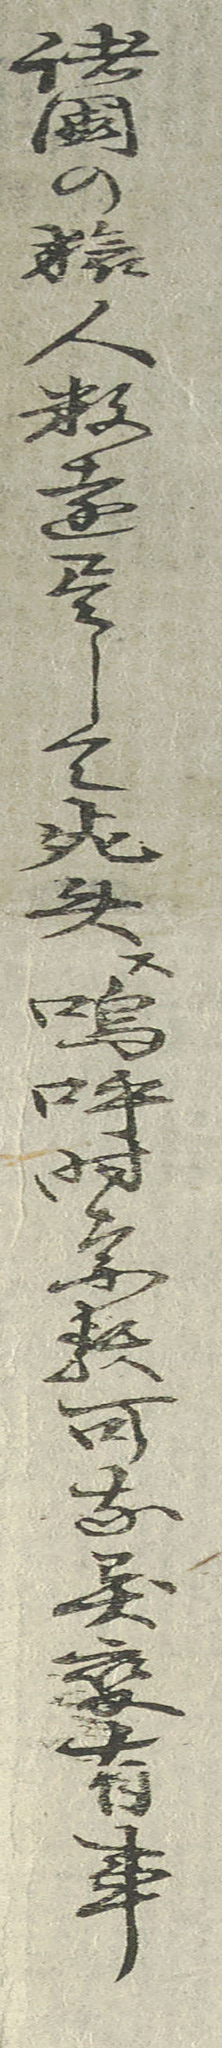諸国の旅人数を尽して死失す嗚呼時なるかな異変有事
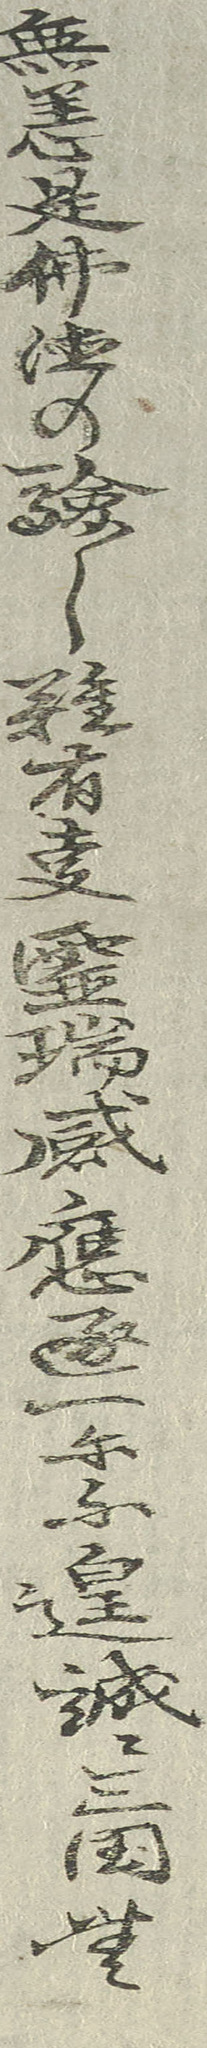無恙是仏徳の験し難有事霊瑞感応逐一に不遑誠に三国無
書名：信濃国大地震後世記録微細色分絵図
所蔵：東京大学総合図書館 General Library in the University of Tokyo, JAPAN
